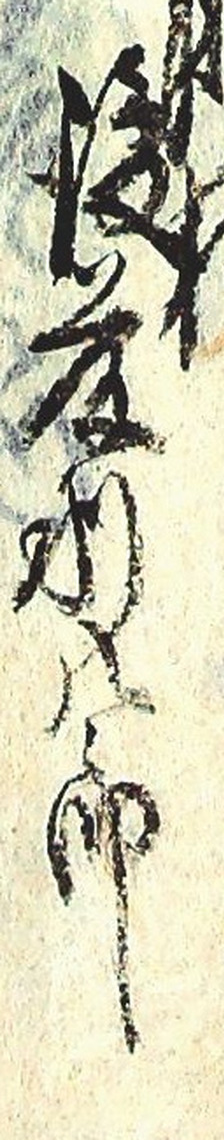後藤利八郎
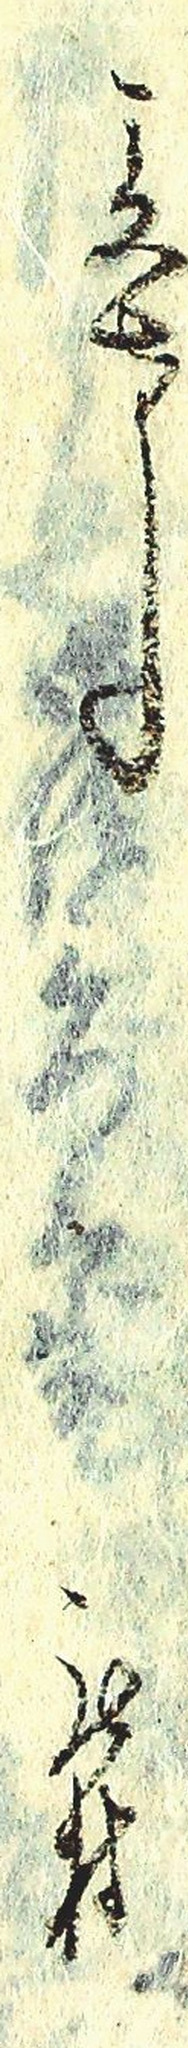亥七月庄村
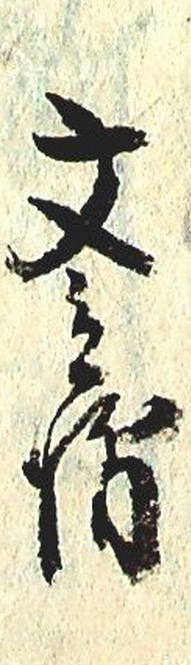文兵衛
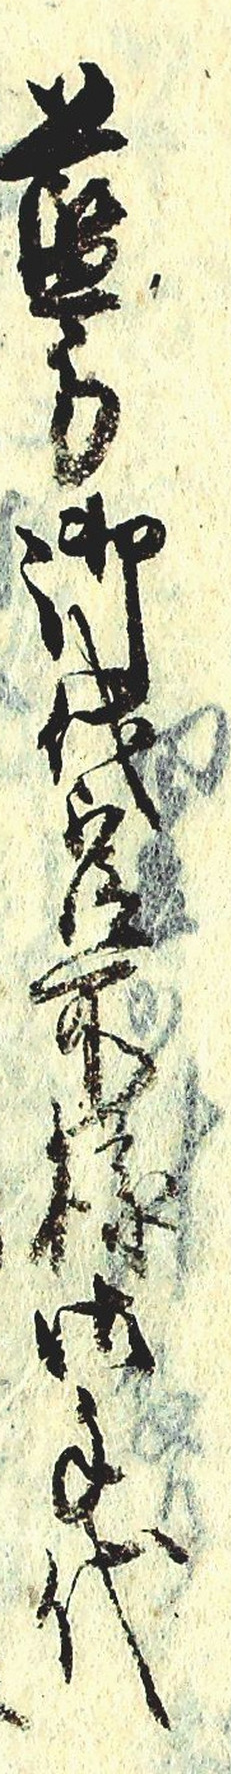藍方御代官所様御手代
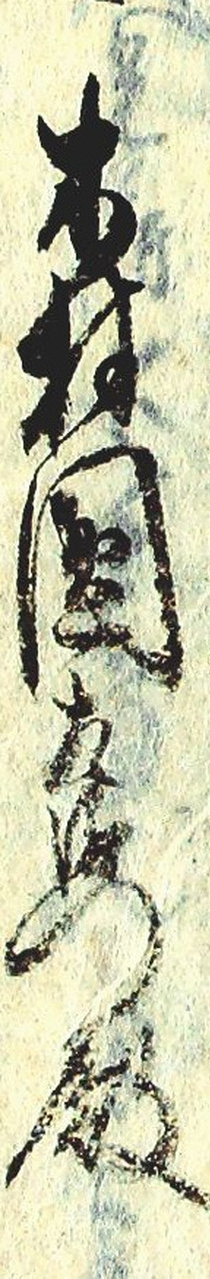木村円左衛門殿
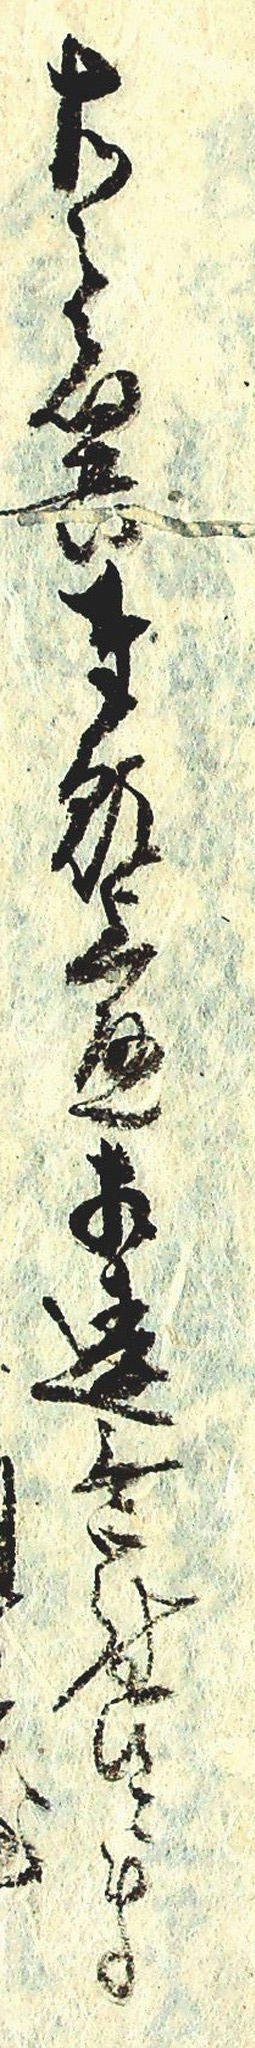右之者共奉願上通相違無御座候に付
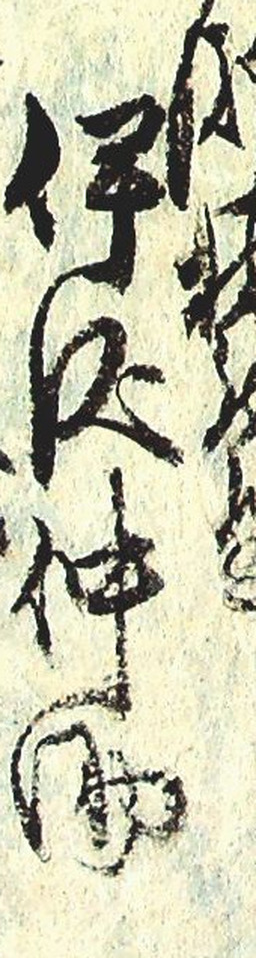伊沢仲助
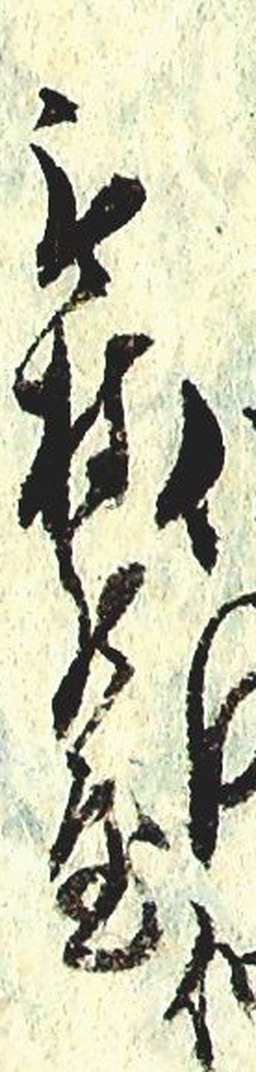庄村庄屋
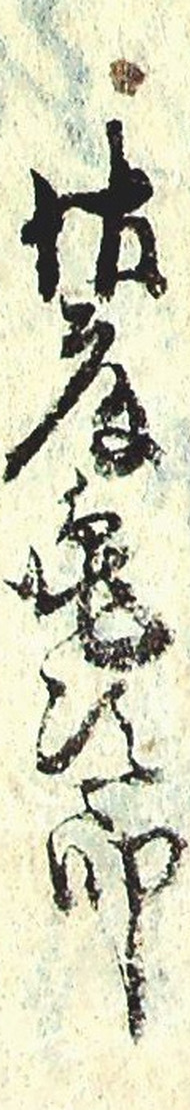佐藤亀次郎
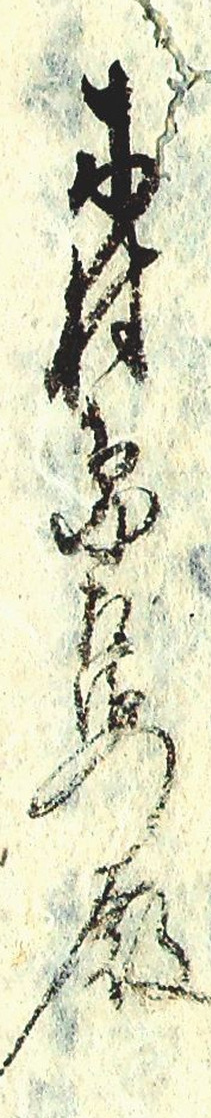木村円左衛門殿

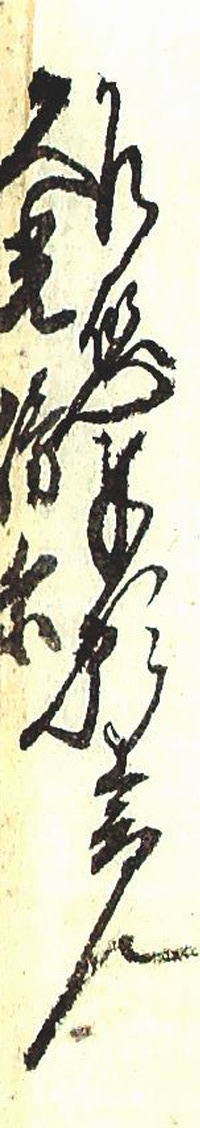乍恐奉願上覚
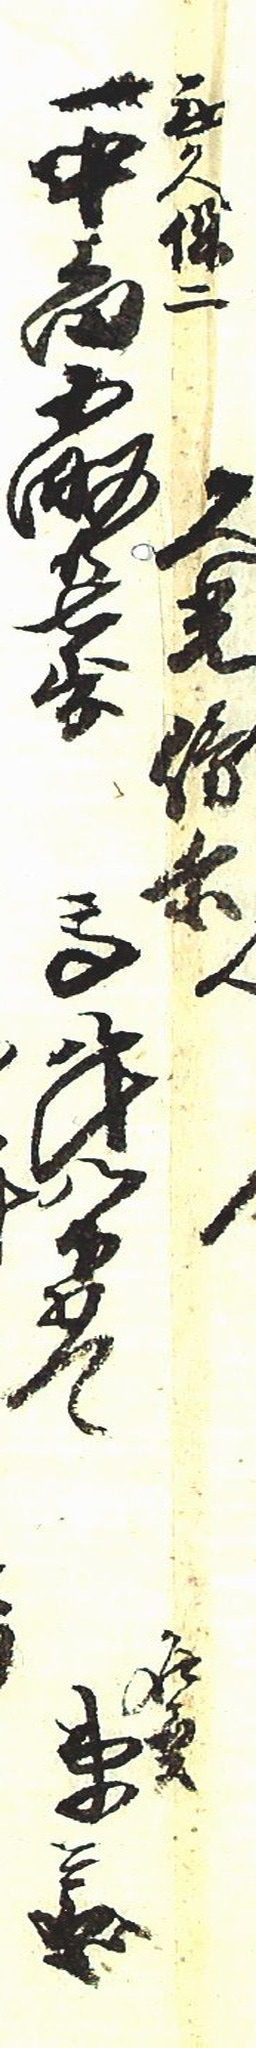一中上田五畝廿七歩高八斗八升五合半兵衛
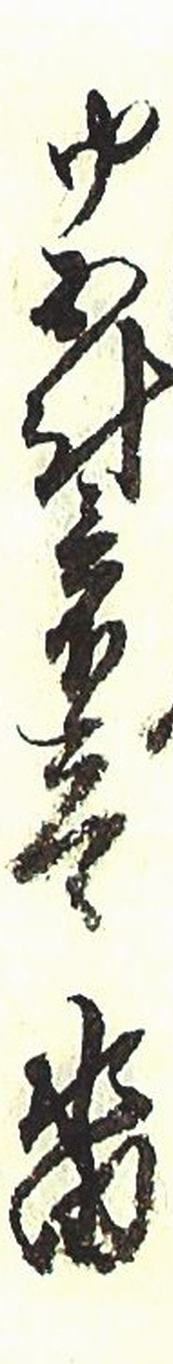内五斗壱升六合水田
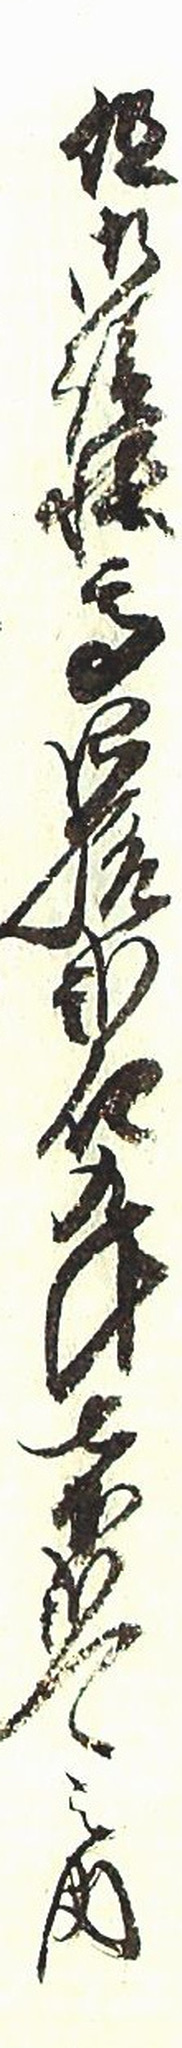但御請帳高四拾弐石九斗七升弐合之内
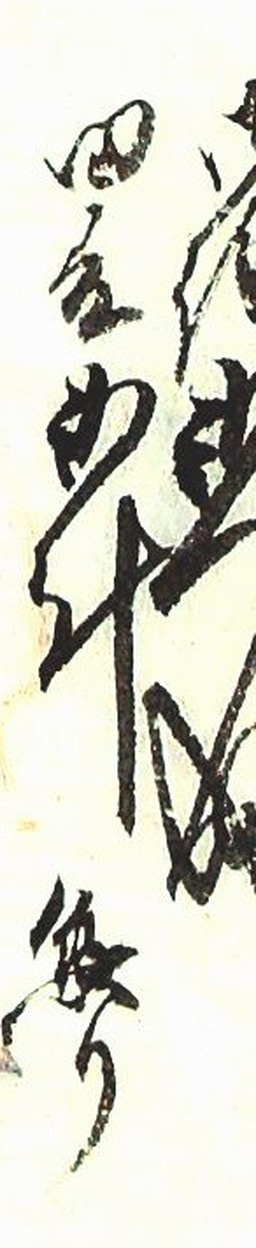田取弐斗懸り
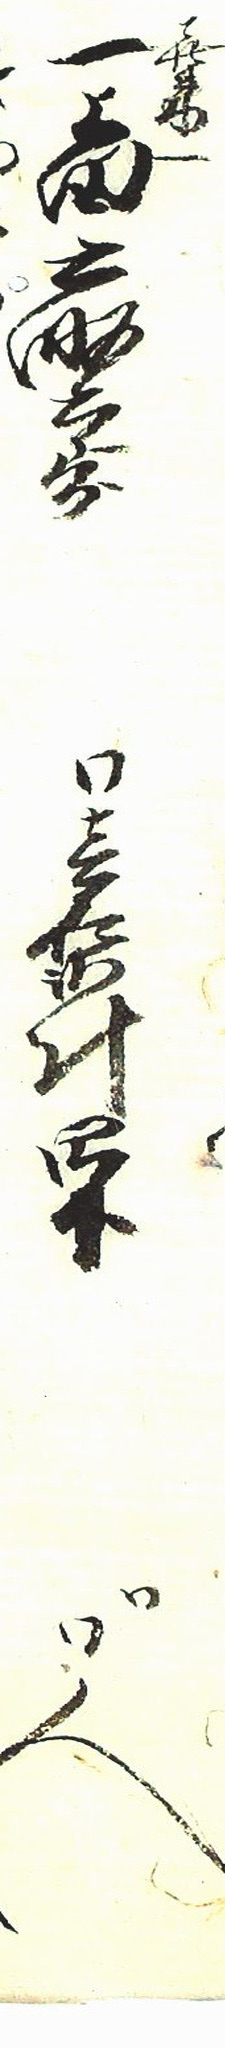一上田六畝六歩同壱石弐斗四升同人
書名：諸御願書控(弐番）
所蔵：鳴門教育大学 Naruto University of Education
